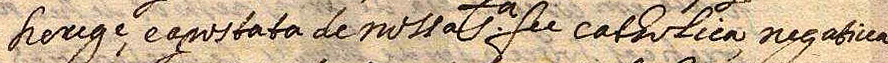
herege, e apostata de nossa Sta. fee catholica, negatiua
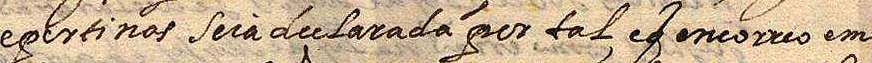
e pertinas seia declarada por tal, e q̄ encorreo em
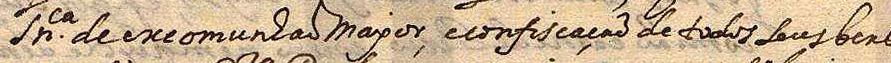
sn.ca de excomunhaõ mayor, e confiscaçaõ de todos seus bens
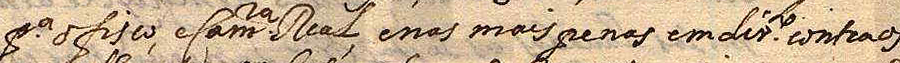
p.a o fisco, e Camra. ReaL, e nas mais penas em dir.to contra os
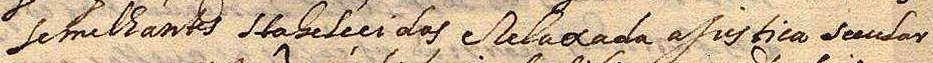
semelhantes stabeleçidas, e Relaxada a Justiça secular
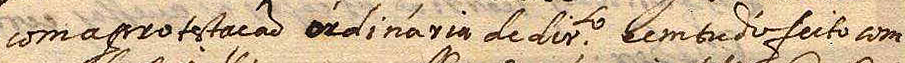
com a protestação ordinaria de dir.to, e em tudo feito com
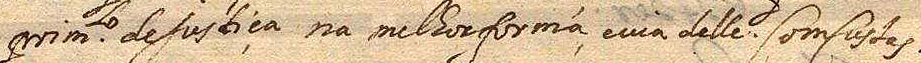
primto. de Justiça na melhor forma, e uia delle. Com Custas.
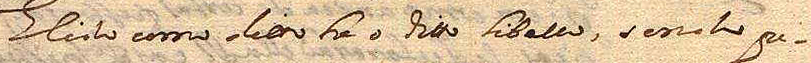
E lido como ditto he o ditto Libello, sendo pe
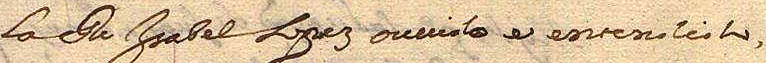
La Re Jzabel Lopez ouuido e entendido,
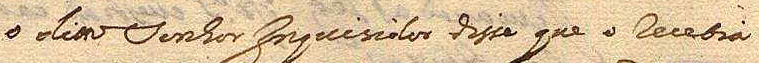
o ditto Senhor Jnquisidor disse que o Recebia
